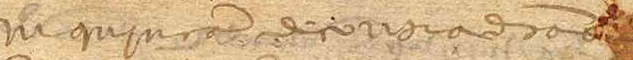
Jnqujricā de contradt̄as de
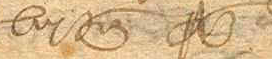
brytiz fr̄z
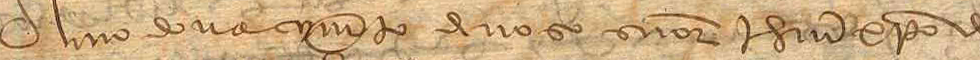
Anno do nacym̄to de noso sn̄or Jhuū xp̄o de
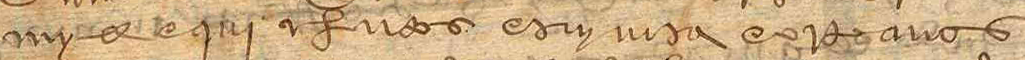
myll e qujnhentos e trymta e ojto anos
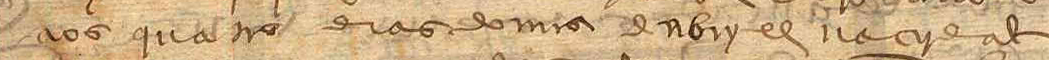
aos quatro dias do mes de abryll na cydade
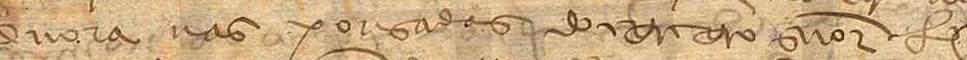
deuora nas pousadas do egregio sn̄or ho s̄or
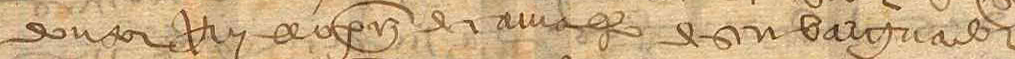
doutor Ruj llopiz de carualho desenbarguador
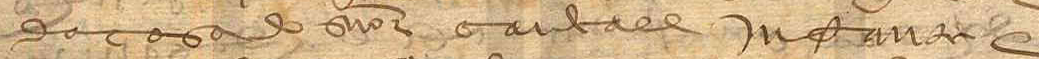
da casa do sn̄or cardeall Jnfante e
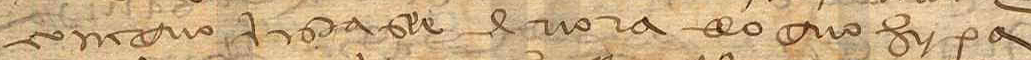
coneguo ē esta see deuora lloguo hy pa
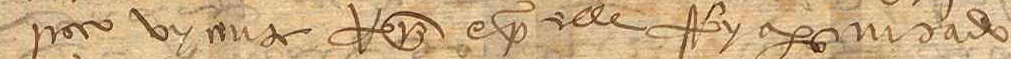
reçeo vycente Rōjz e p̄o elle ffoy aꝑsemtado
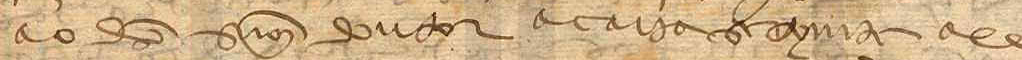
ao dt̄o sn̄or doutor a carta segymte all
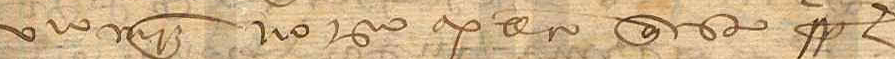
vro mj̄z notro apl̄lco q̄ esto sp̄vj
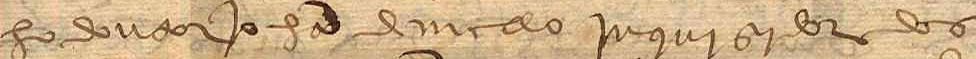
ho doutor Johā de mello Jnqujsjdor dos
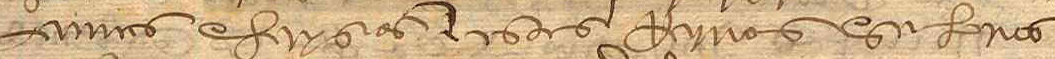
crimees e herysias ē estes Reynos e senhorios
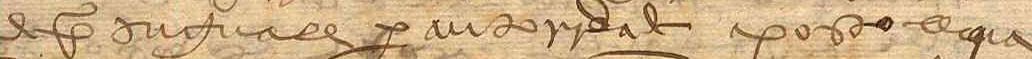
de p̄otuguall ꝑ autorydade apostolliqua
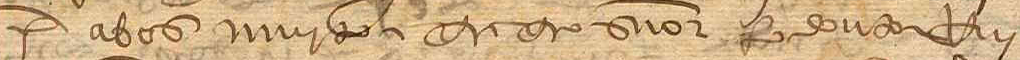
c̄ꝭ a vos mujto egregio s̄nor ho doutor Ruj
